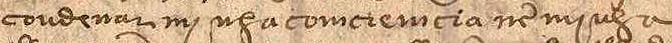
condenar mjnha comciemcia nē mjnha
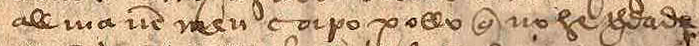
allma nē meu corpo pollo q̄ no he ꝟdade
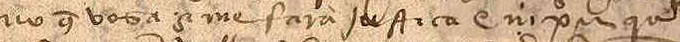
no q̄ vosa s. me farà Justiça e m. porquā
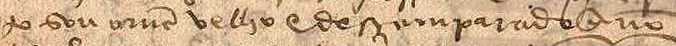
to sou omē velho e dessemparado q̄ nō
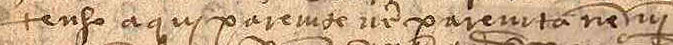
tenho aquj paremte nē paremta nē nj̄
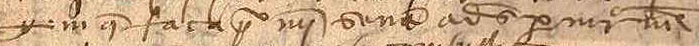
gem q̄ faça p̄o mj̄ senā a ds̄ ꝑmramte
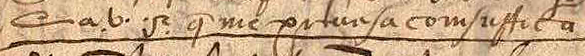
e a v. s. q̄ me proueJa com Justiça
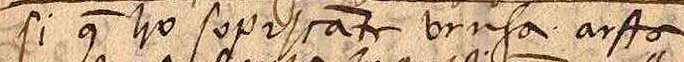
si q̄ ho soprjcāte venha a esta
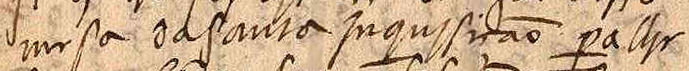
mesa da santa Jnqujsição ꝑa lhe
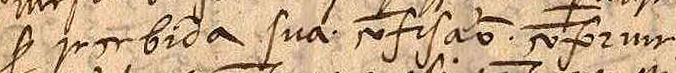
ꞩ recebida sua cōfisão cōforme
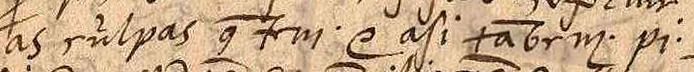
as culpas q̄ tem e asi tābem. pi
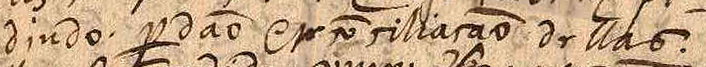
dindo ꝑdão e recōciliação dellas.
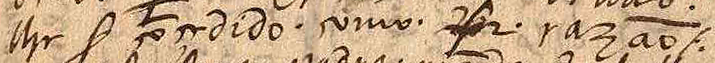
lhe ꞩ cōcedido. como for razão /.
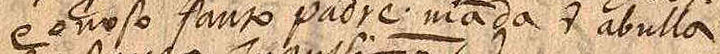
e o noso santo padre māda ē a bulla
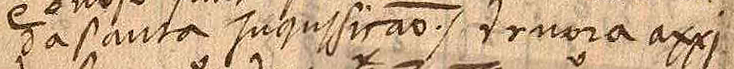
da santa Jnqujsição ./ ē euora a xxj
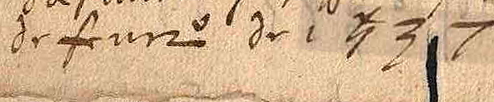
de feuero de 1537
